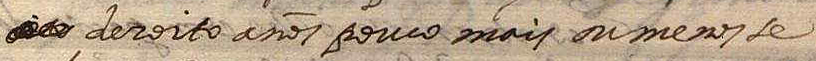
_ dezoito anōs pouco mais ou menos se
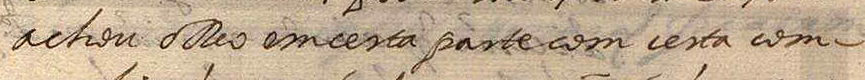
achou o Reo em certa parte com certa com
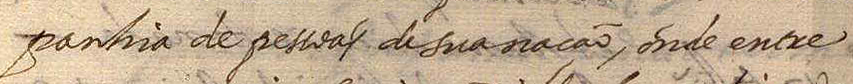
panhia de pessoas de sua naçaõ, onde entre
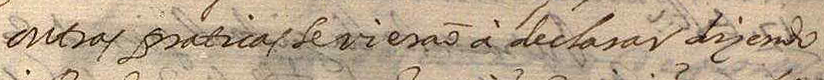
outras praticas se vieraõ a declarar dizendo
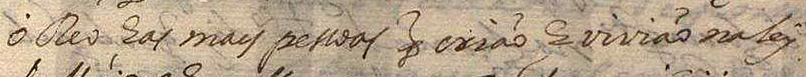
o Reo, E as mais pessoas q̄ criaõ, E viviaõ na ley
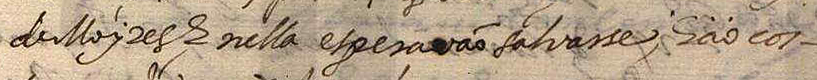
de Moyzes, E nella esperavaõ salvarse, E ao cos
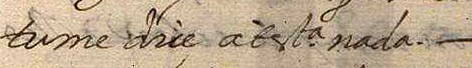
tume dice, a test.a nada. -
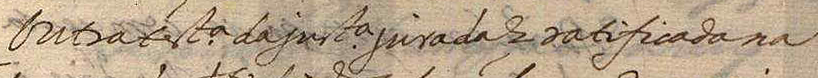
Outra test.a da just.a jurada, E ratificada na
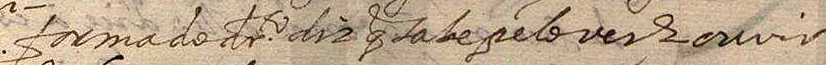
forma do d̄r.to diz q̄ sabe pelo ver, E ouvir
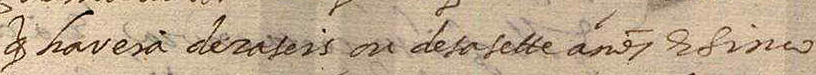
q̄ havera dezaseis ou desasette anōs E sinco
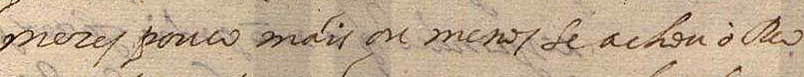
mezes pouco mais ou menos se achou o Reo
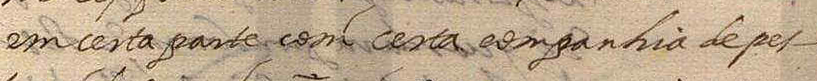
em certa parte com certa companhia de pes
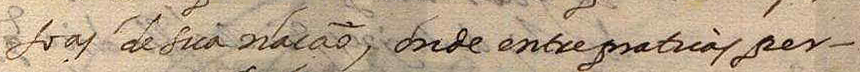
soas de sua naçaõ, onde entre praticas per
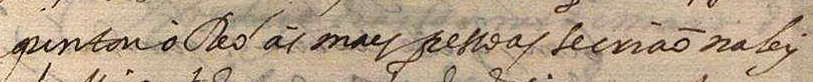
guntou o Reo às maes pessoas se criaõ na ley
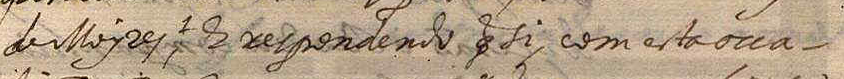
de Moyzes, 1 E respondendo q̄ si, com esta occa
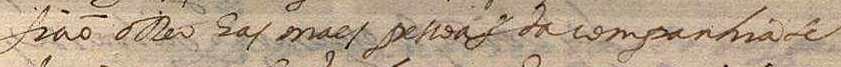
siaõ o Reo E as maes pessoas da companhia se
